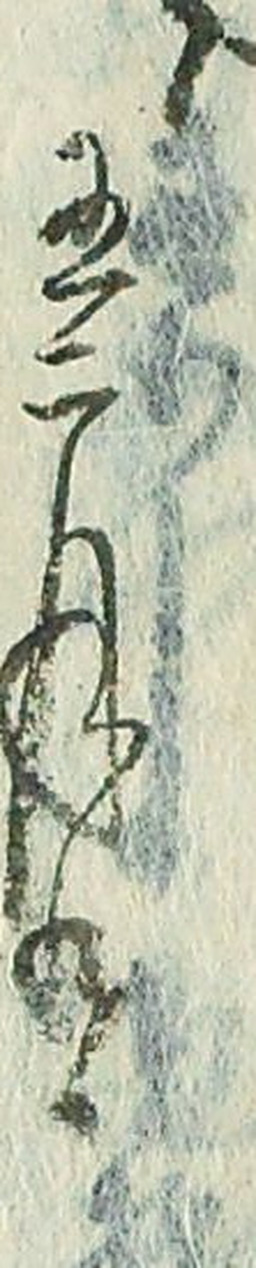丑二月九日
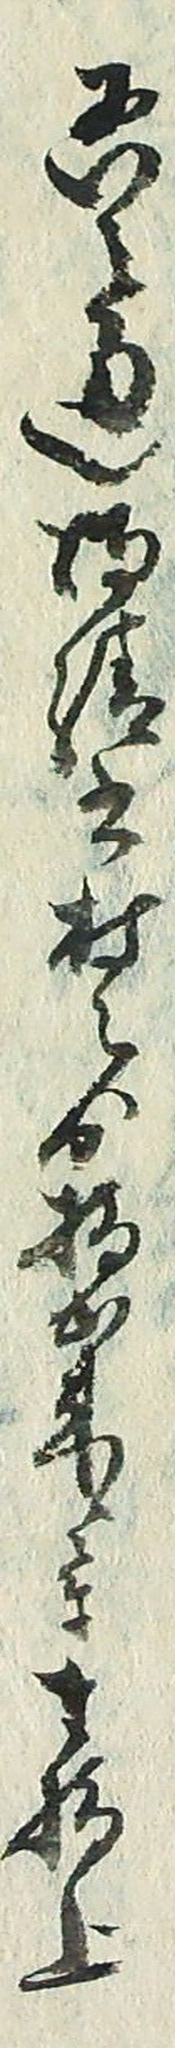右之通御請書村々ゟ指出来候に付奉指上
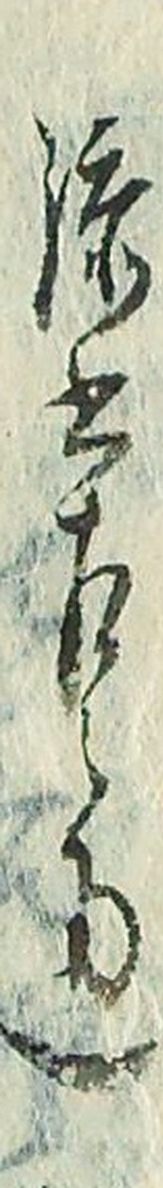添書左之通
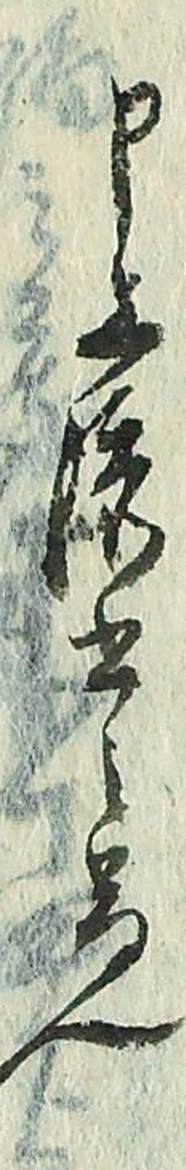申上添書之覚
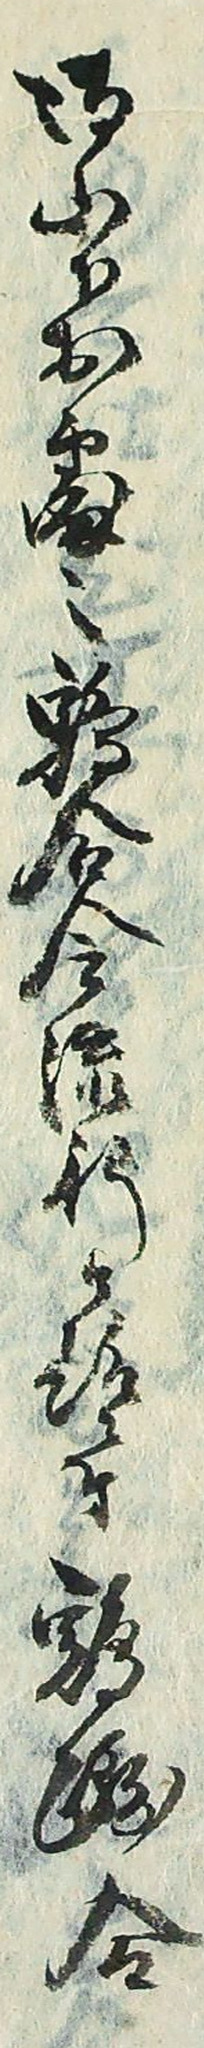御山下於処々鶏合令流行候趣に付鶏蹴合
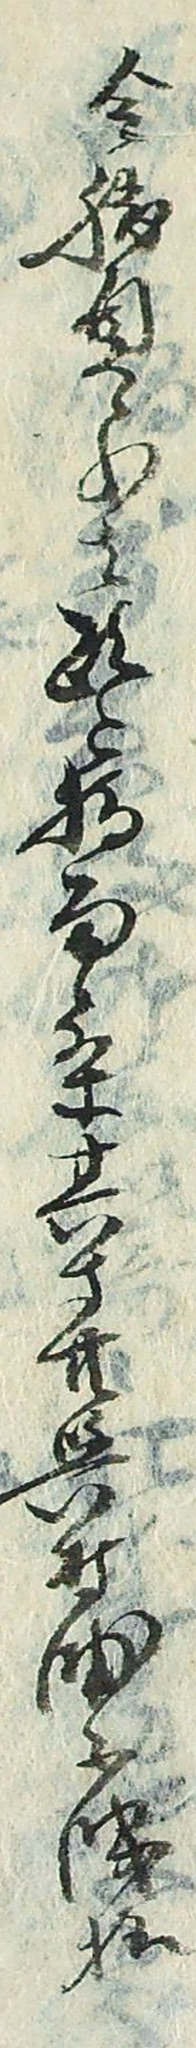令勝負候義は屹と指留候条其方共与村浦不洩様
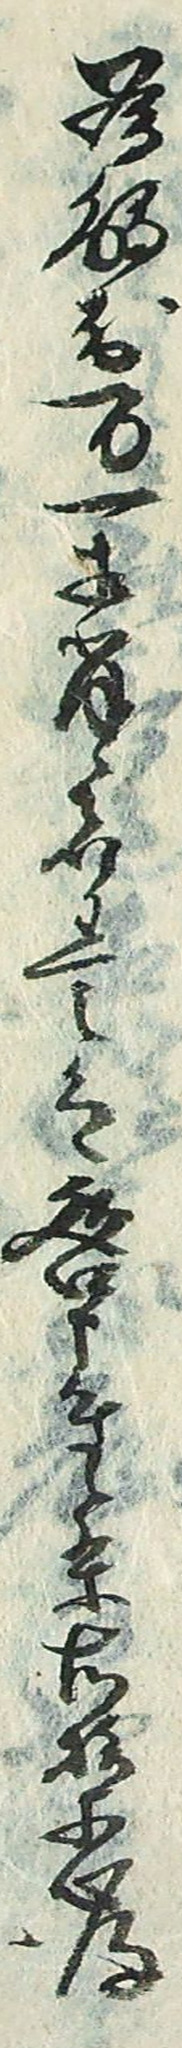為触知万一相背候者有之候はゝ咎申付候条右様相心得
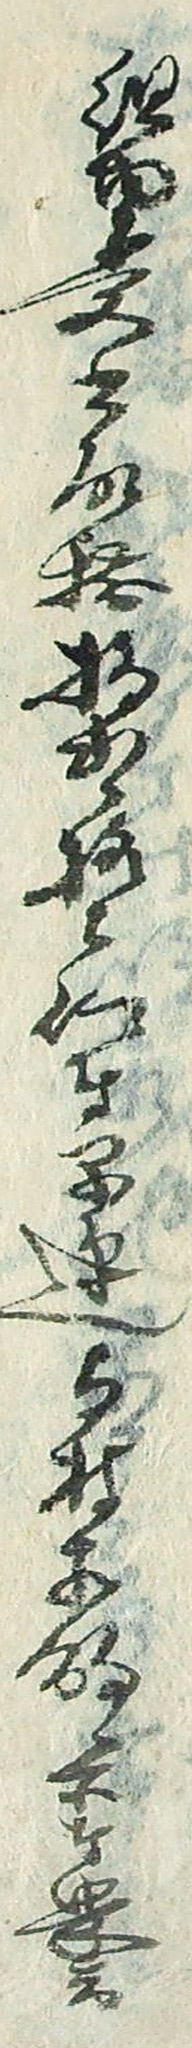組切受書取揃指出候様被仰付早速与村相触候所奉畏旨
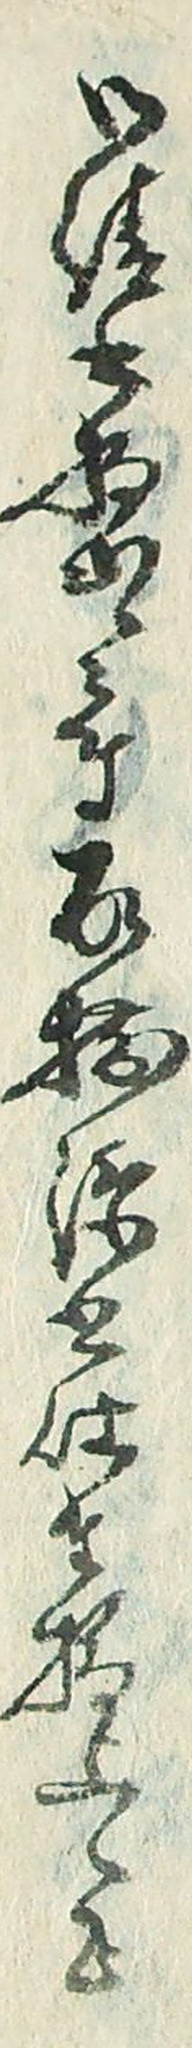御請書指出候に付取揃添書仕奉指上候以上

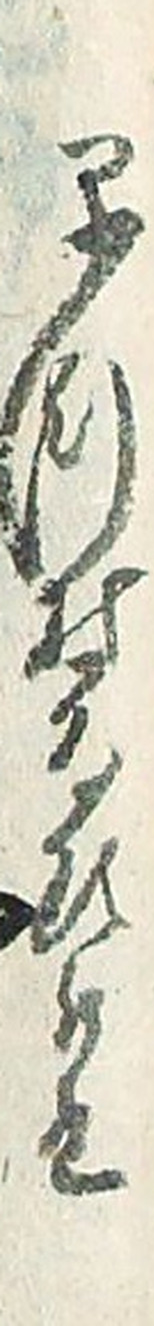早淵村与頭庄屋
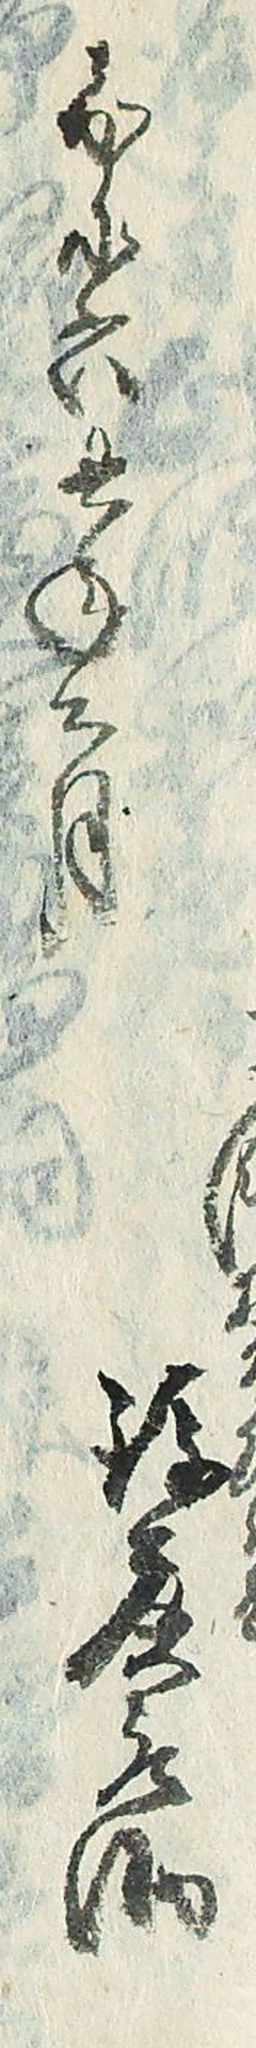嘉永六丑年二月後藤庄助
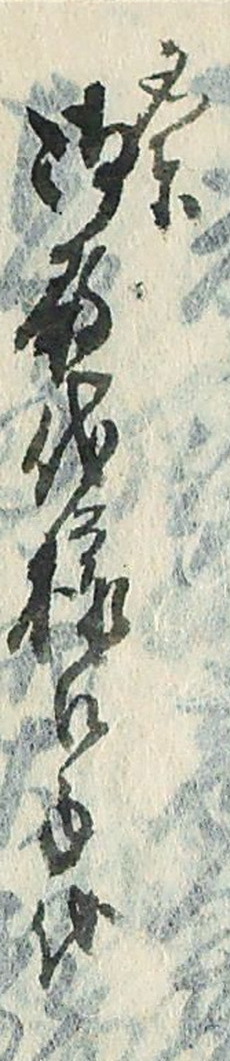御郡代様御手代
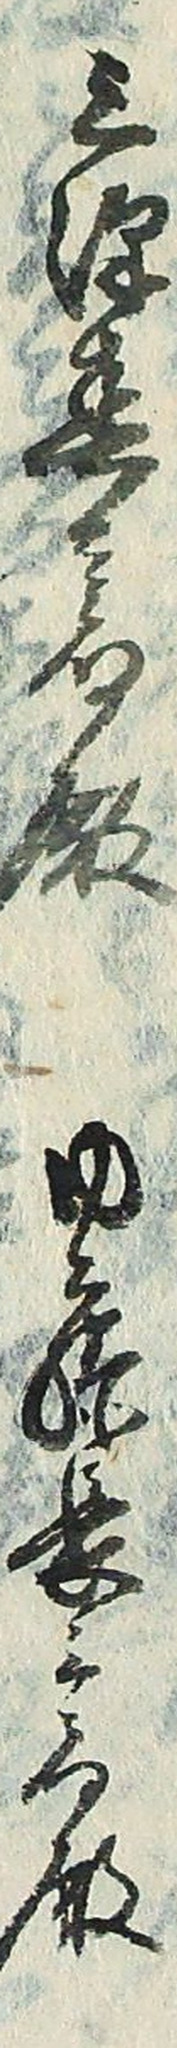三沢春太郎殿内藤長三郎殿
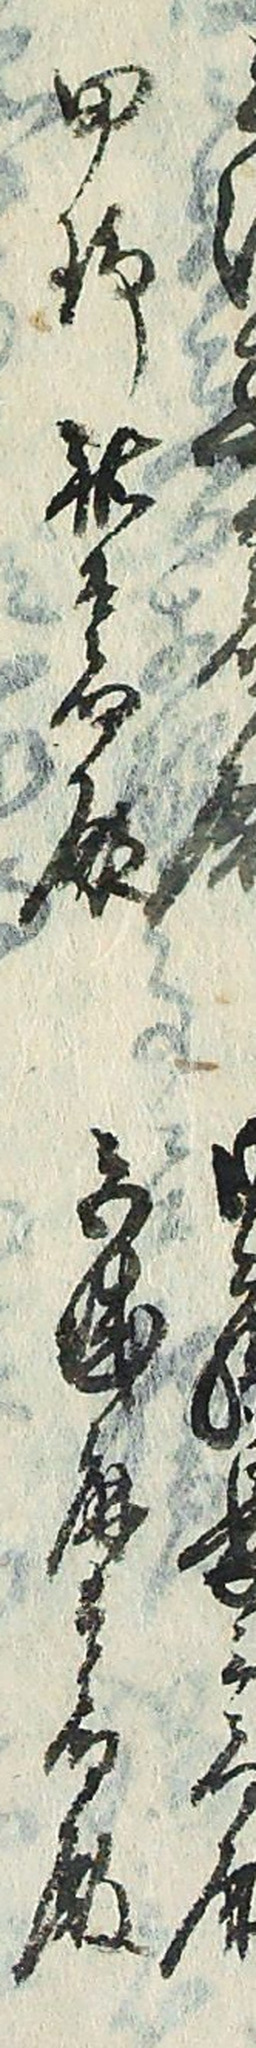田野祐太郎殿宮城麻太郎殿
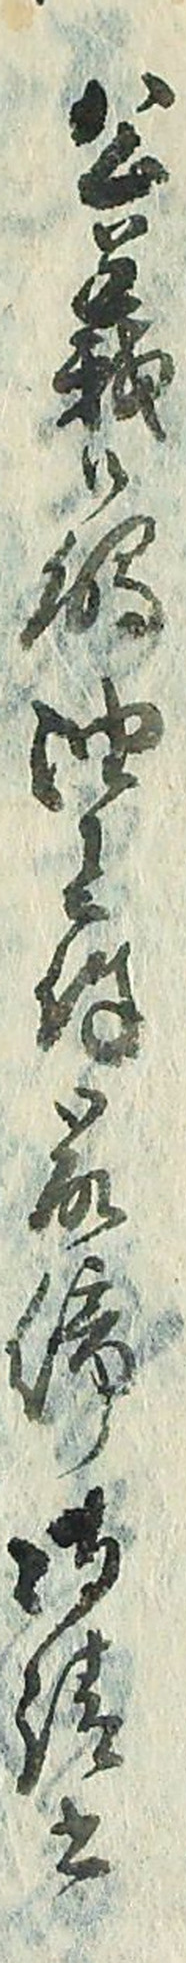公義御触油之荷御取締御請書
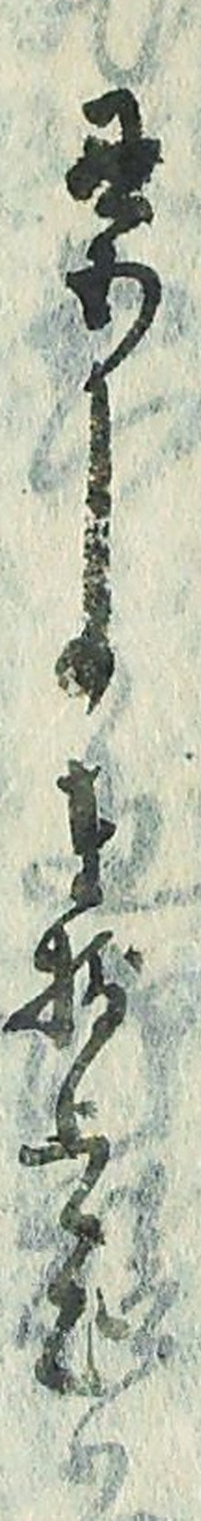丑五月奉指上候以上
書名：諸御用御□受書控
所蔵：鳴門教育大学 Naruto University of Education
